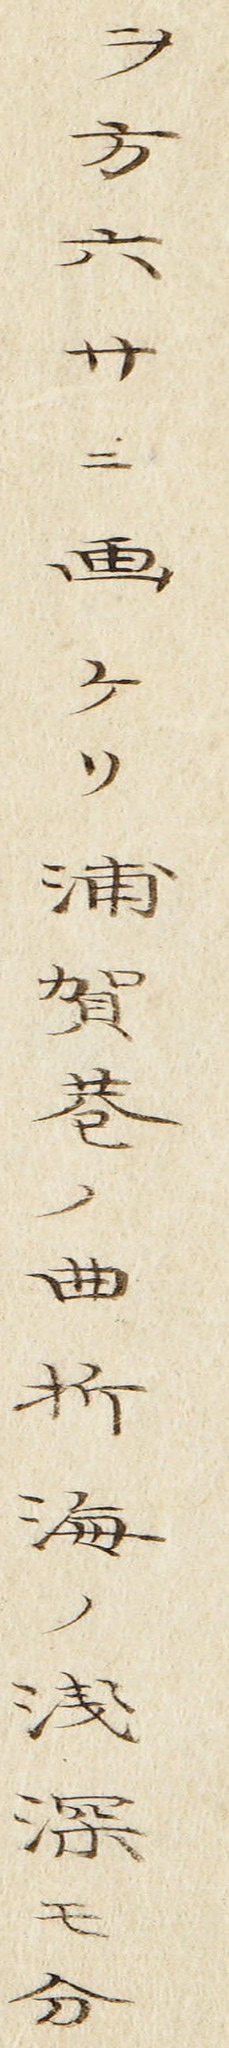ヲ方六寸ニ画ケリ浦賀巷ノ曲折海ノ浅深モ分
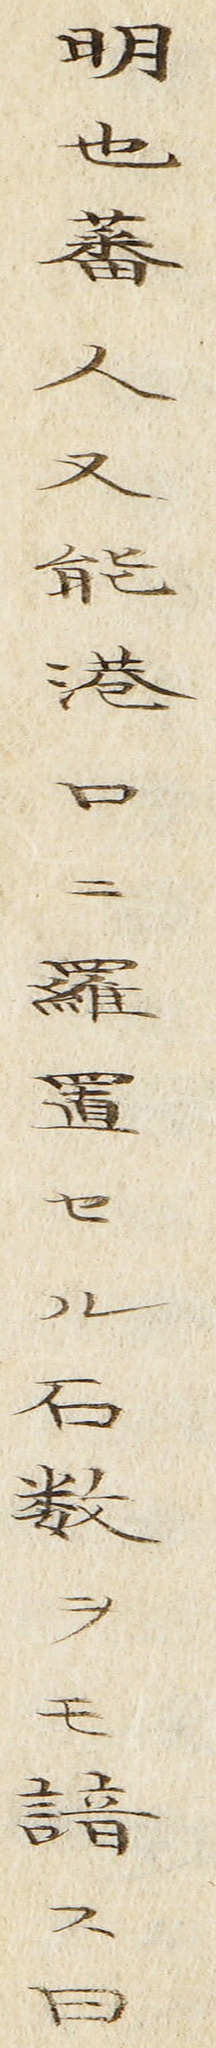明也蕃人又能港口ニ羅置セル石数ヲモ諳ス曰
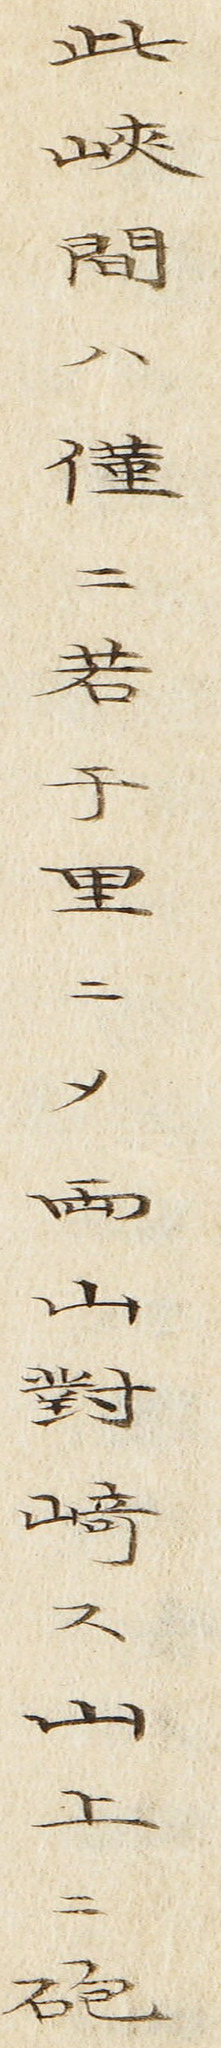此峡間ハ僅ニ若干里ニシテ両山對崎ス山上ニ砲
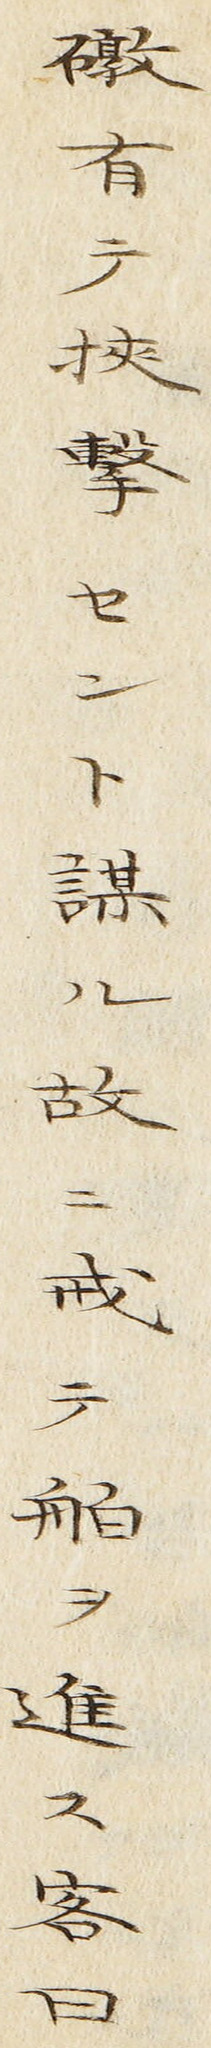礅有テ挟撃セント謀ル故ニ戒テ舶ヲ進ス客曰
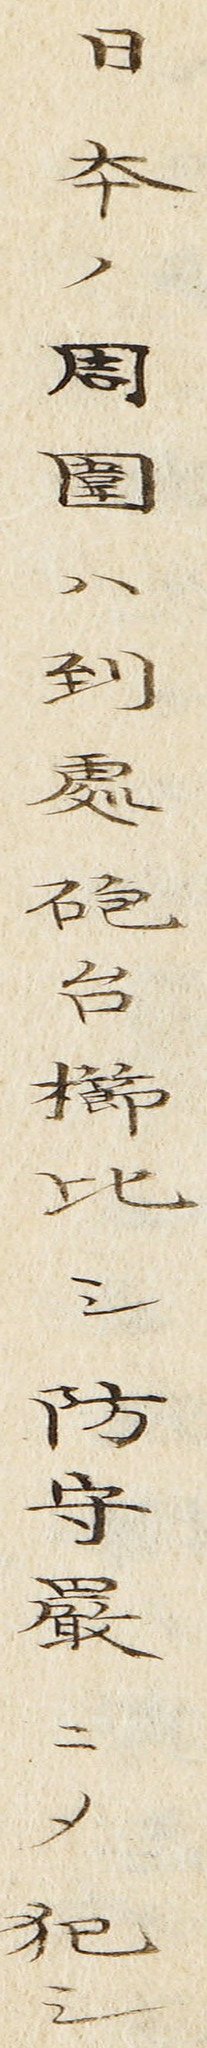日本ノ周圍到處砲台櫛比シ防守厳ニシテ犯シ
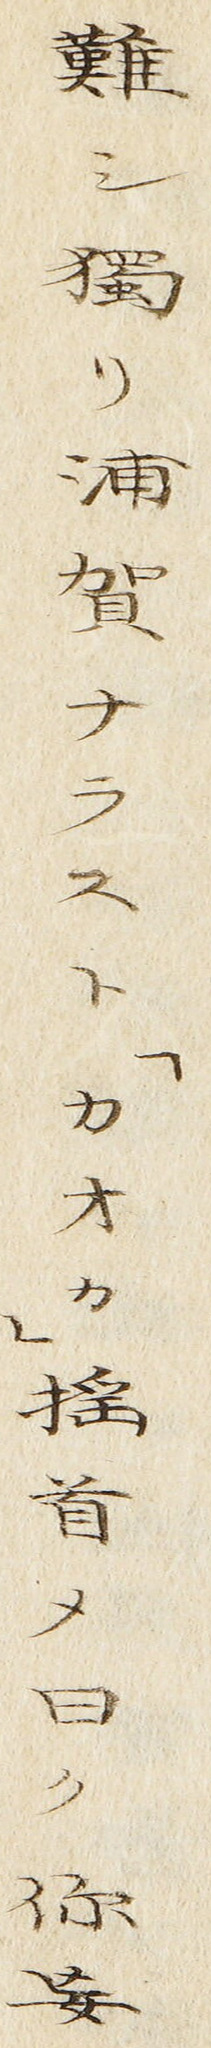難シ獨浦賀ナラスト「カオカ」揺首シテ曰ク你妄
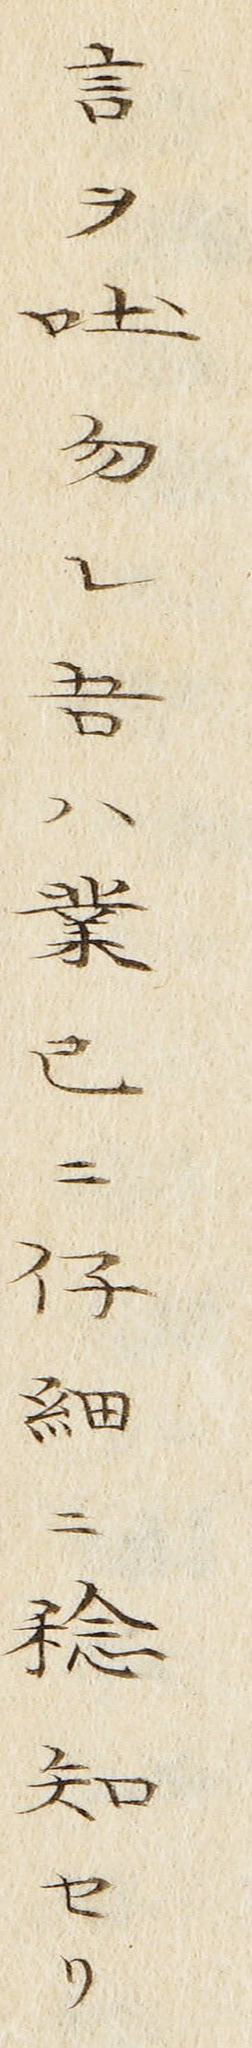言ヲ吐勿レ吾ハ業已ニ仔細ニ稔知セリ
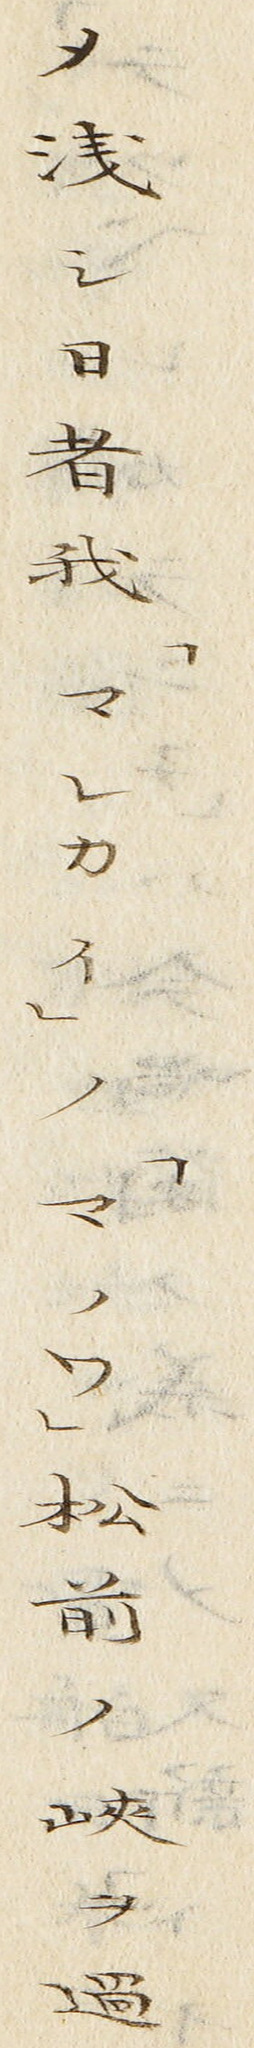シテ浅シ日者我「マレカイ」ノ「マノワ」松前ノ峡ヲ過
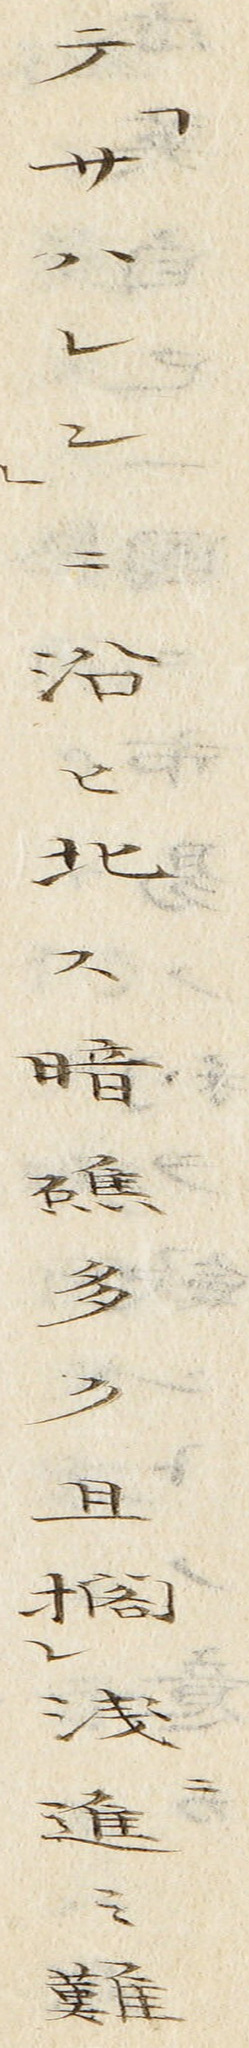テ「サハリン」ニ沿ヒ北ス暗礁多ク且擱浅進ミ難
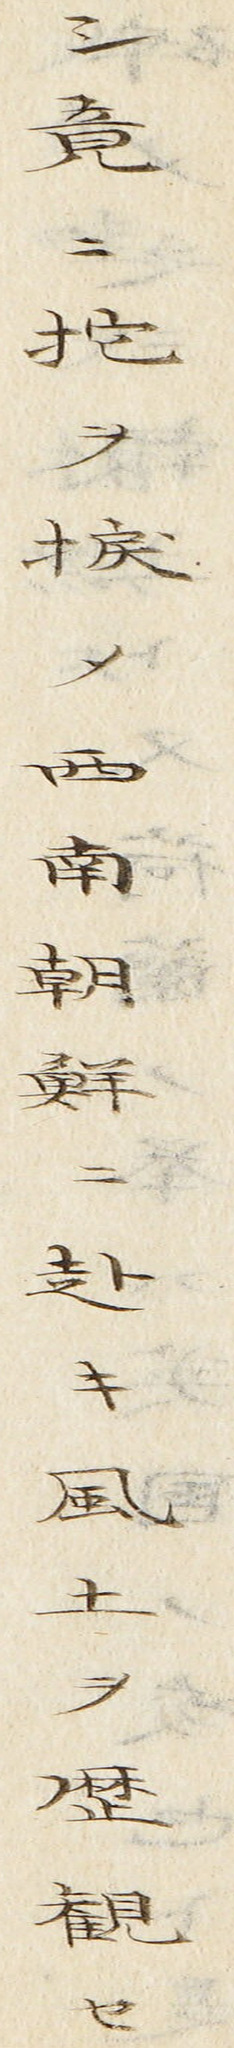シ竟ニ柁ヲ捩シテ西南朝鮮ニ赴キ風土ヲ歴観セ
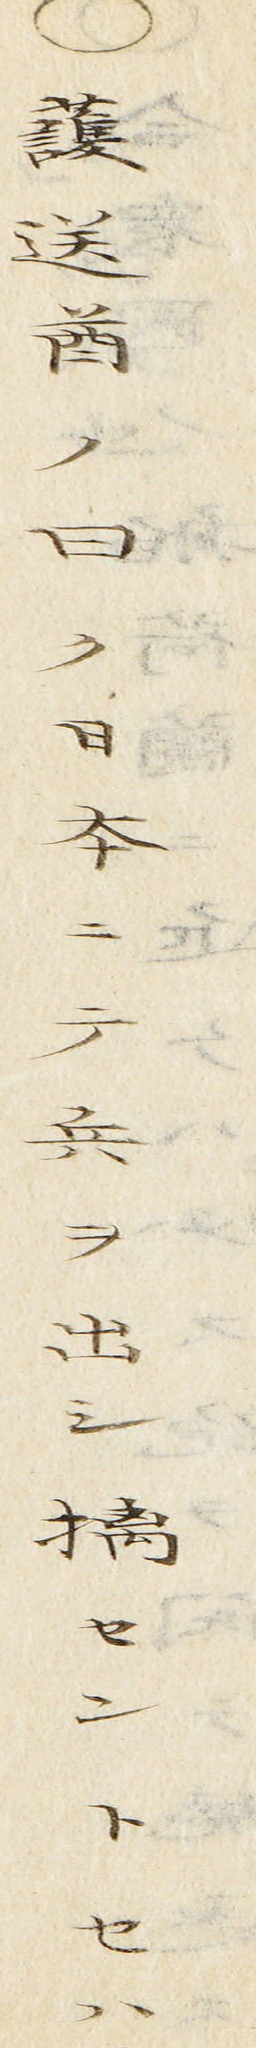〇護送酋ノ曰ク日本ニテ兵ヲ出シ摛セントセハ
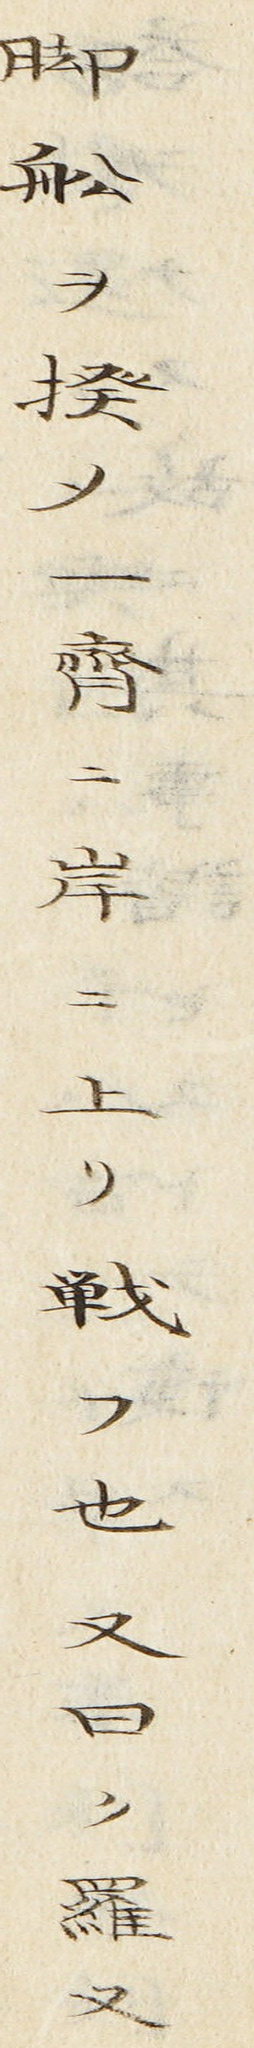脚舩ヲ揆シテ一齊ニ岸ニ上リ戦フ也又曰ク羅又
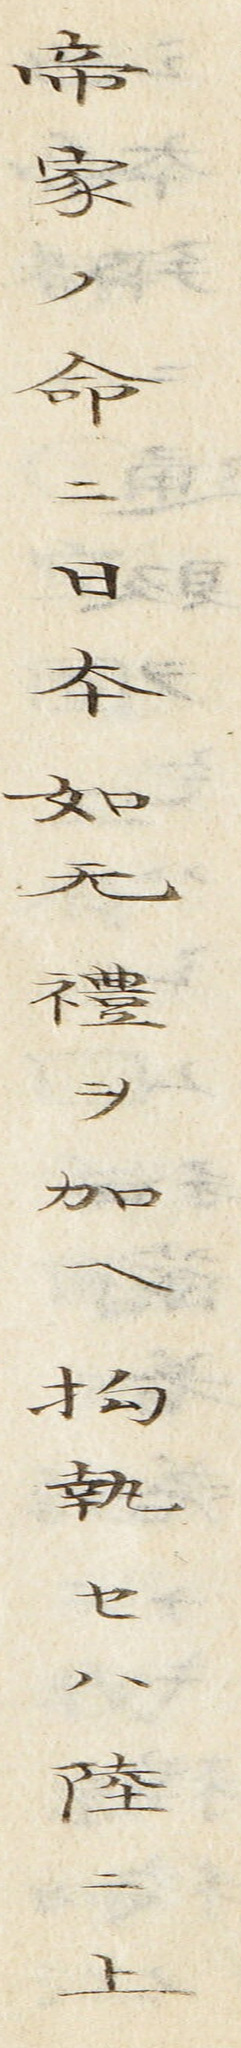帝家ノ命ニ日本如无禮ヲ加ヘ拘執セハ陸ニ上
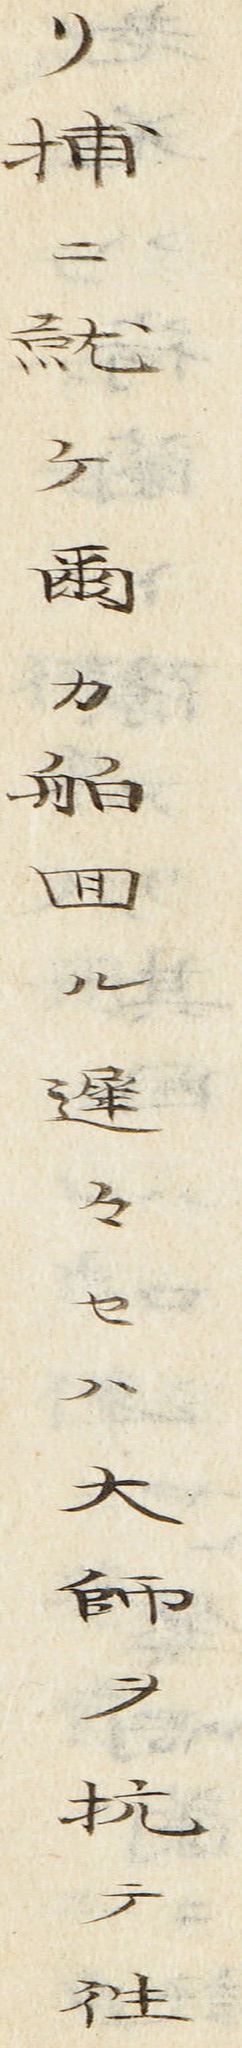リ捕ニ就ケ爾カ舶回ル遅々セハ大師ヲ抗テ往
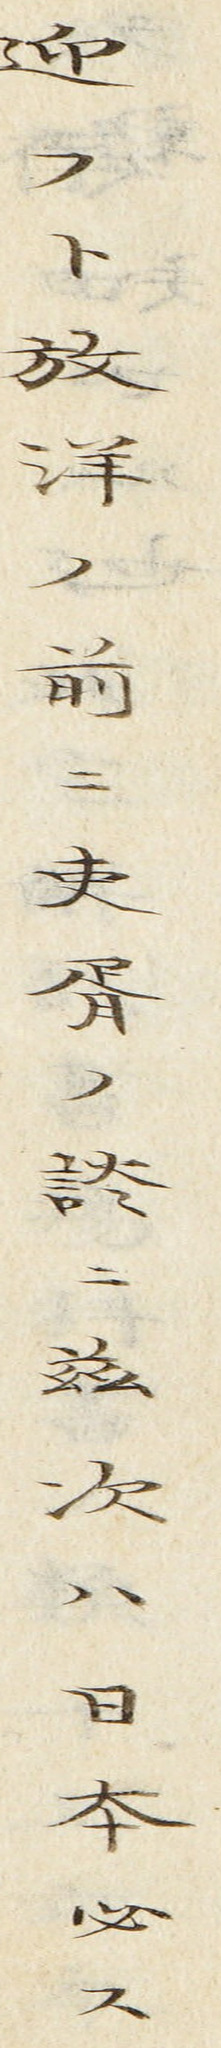迎フト放洋ノ前ニ吏胥ノ談ニ茲次ハ日本必ス
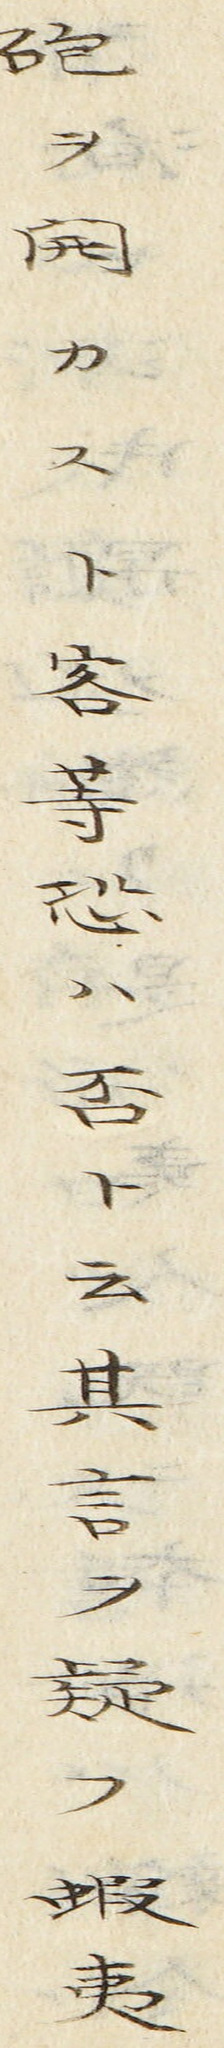砲ヲ開カスト客等恐ハ否ト云其言ヲ疑フ蝦夷
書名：蕃談
